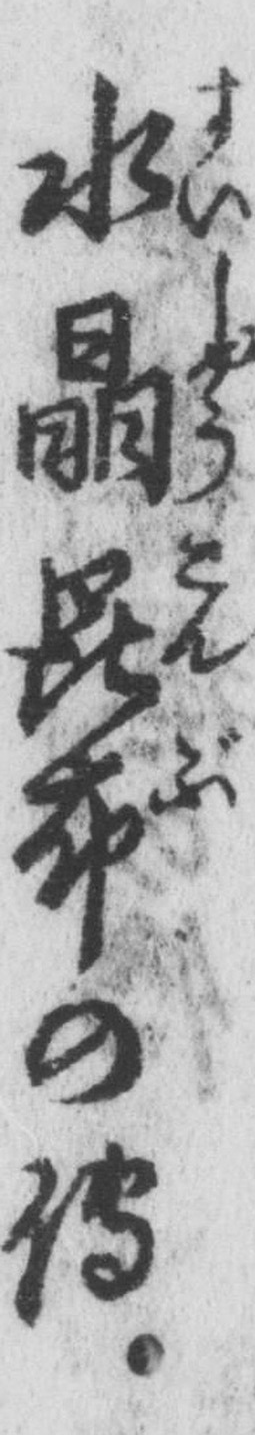水晶昆布の傳
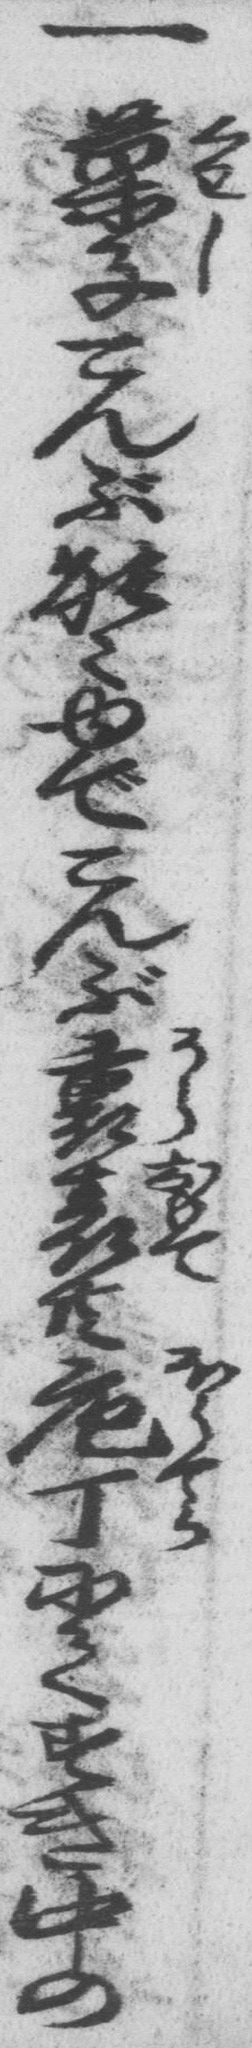一菓子所をこんぶ能々ゆでこんぶ裏表庖丁にてすき中の
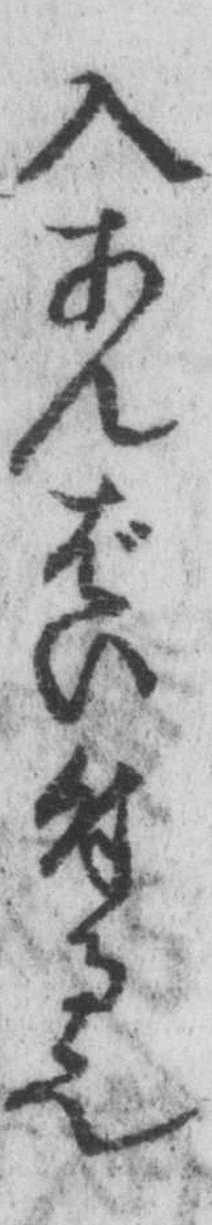入あんばいする也

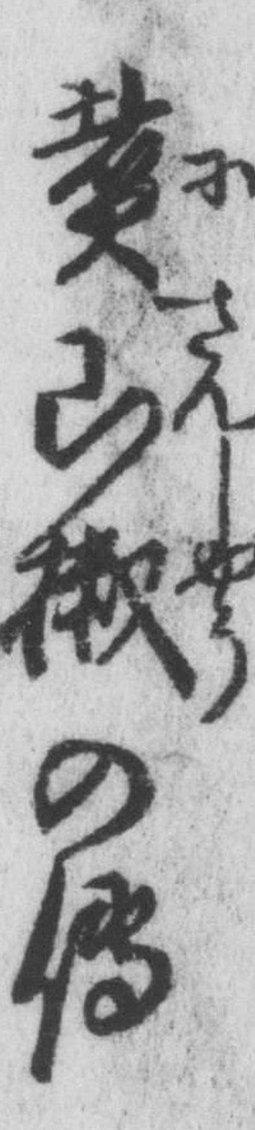煮山椒の傳
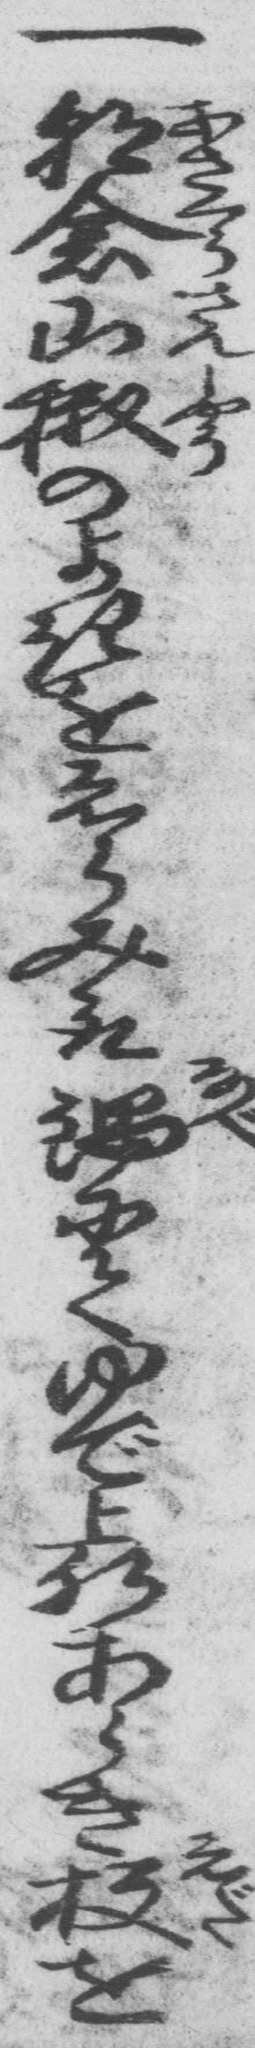一あさくらのよきをゑらみ鳥鍋にてゆで上あらき枝を
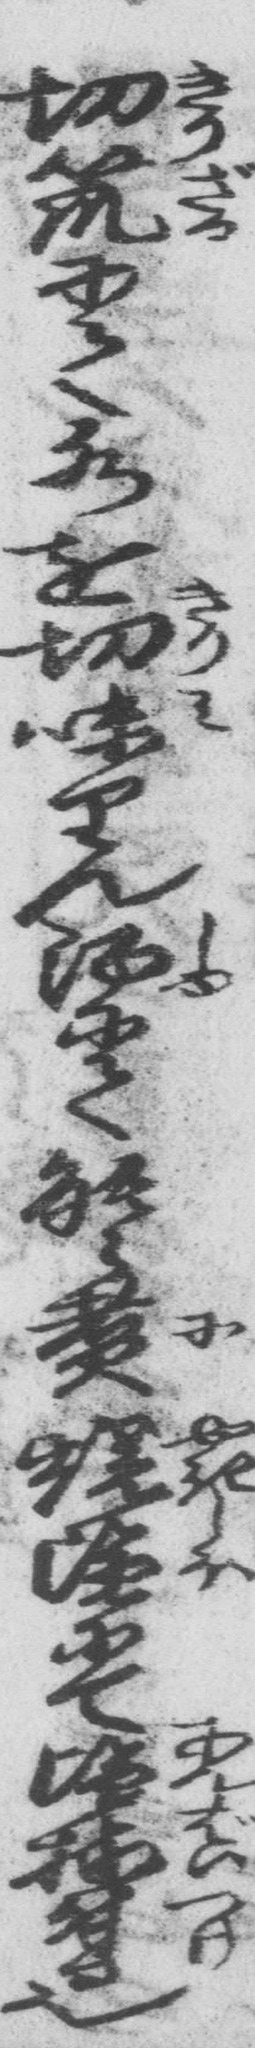切笊にて水を切味りん酒にて能々煮焼塩にて塩梅する也
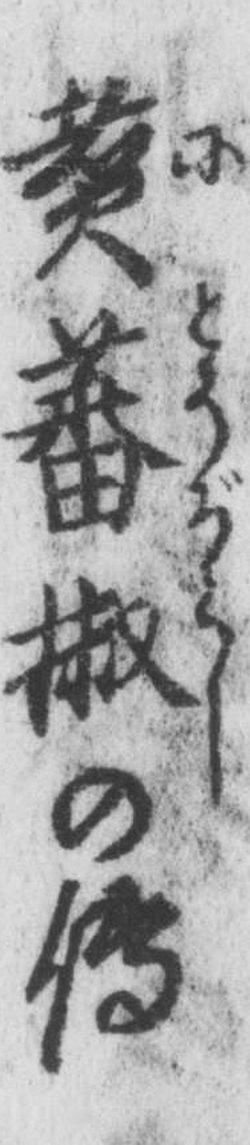煮蕃椒の傳
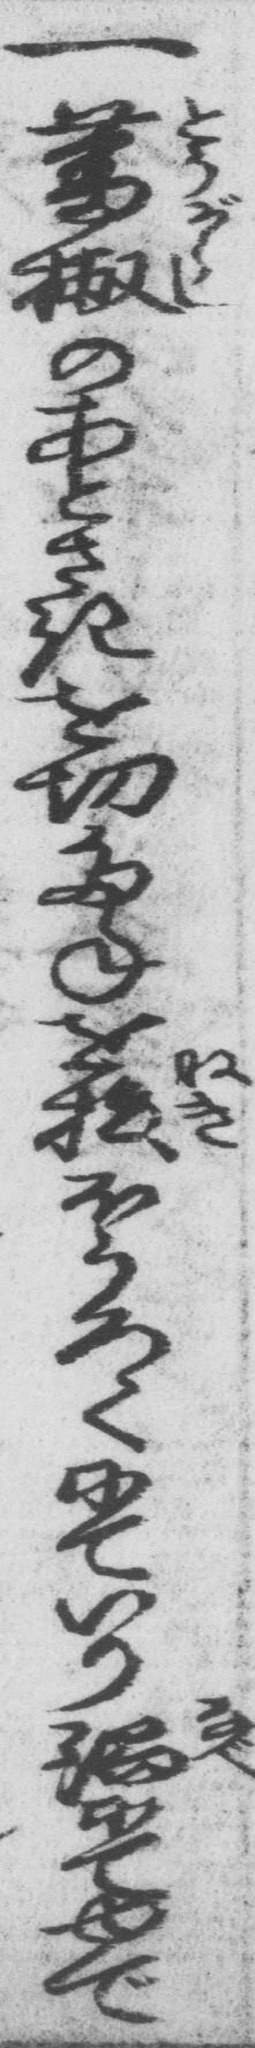一蕃椒のあとさきを切たねを抜ほうろてにていり鍋にてゆで
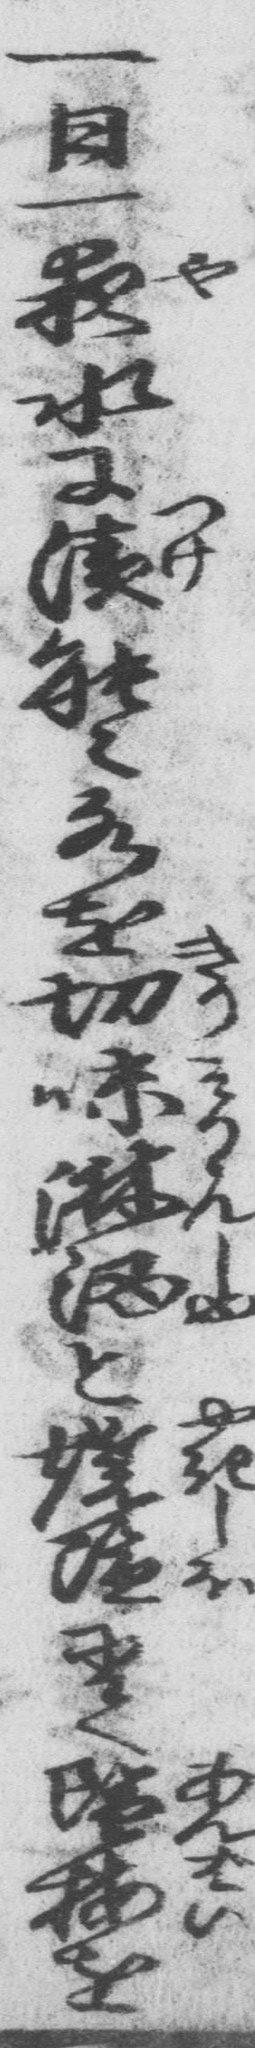一日一夜水に漬能々水を切酒とと焼塩にて塩梅味
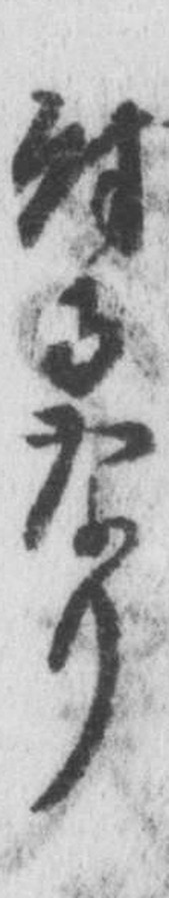付るなり
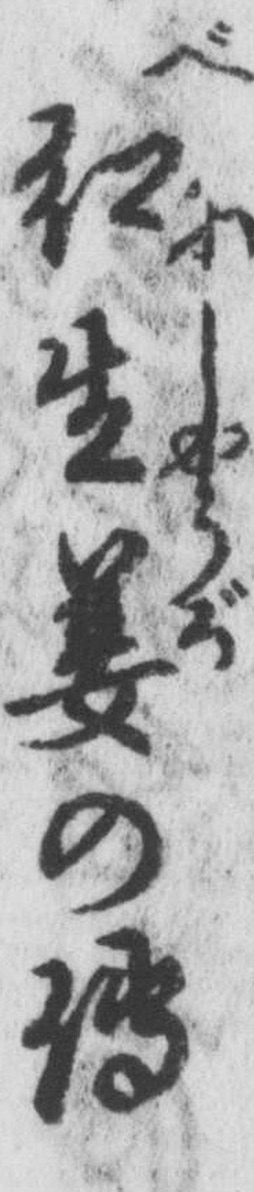紅生姜の傳
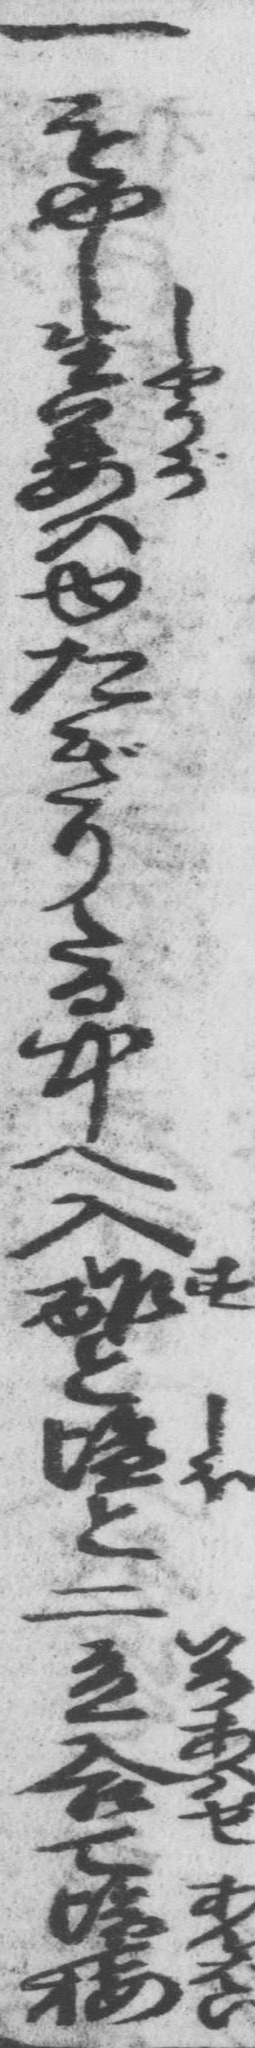一もやし生姜ハゆたぎりたる中へ入酢と塩と合て塩梅
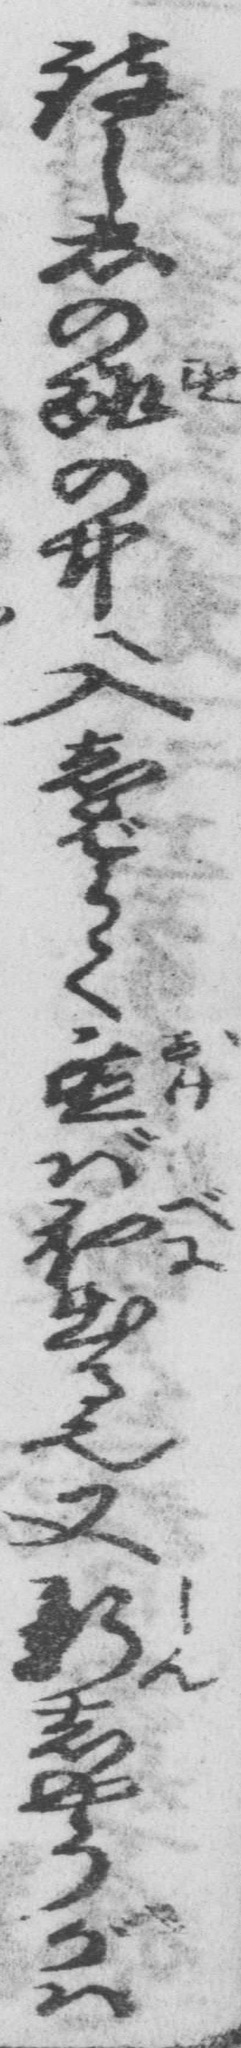しの酢の中へ入しばらく置バ紅出る新しやうがハ
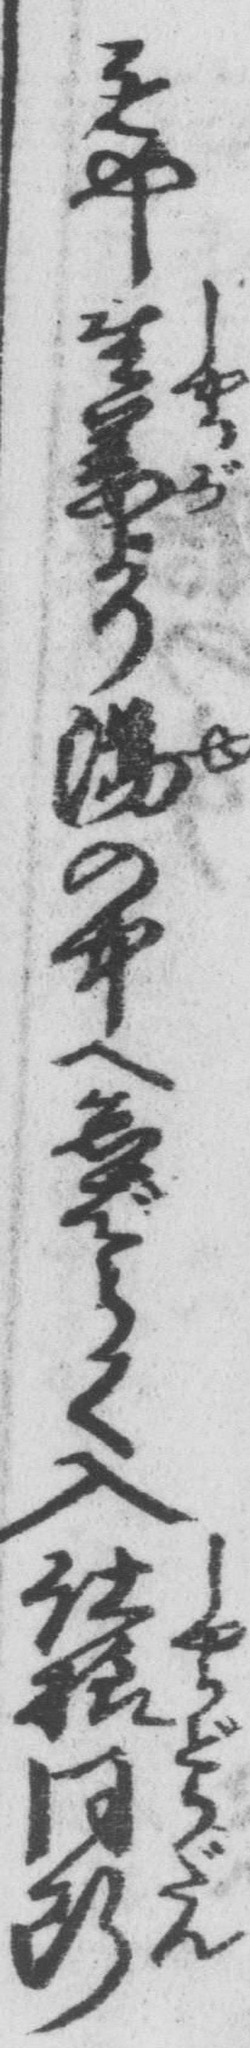もやし生姜より湯の中へしばらく入同段也
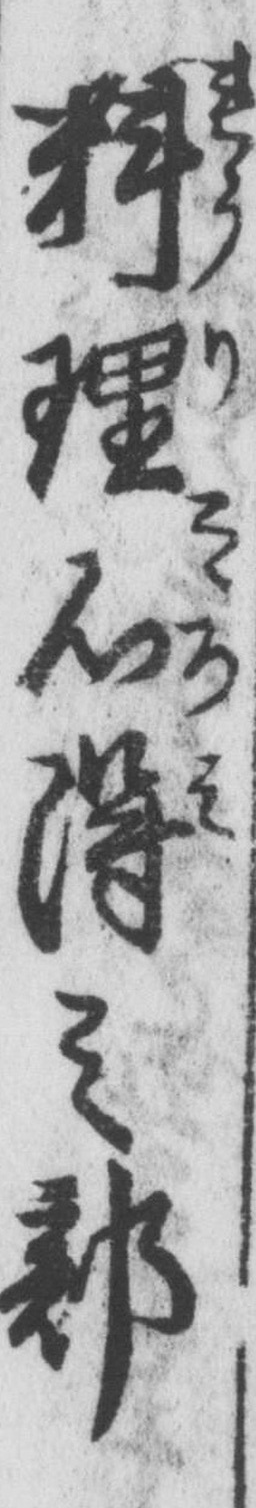料理心得之部
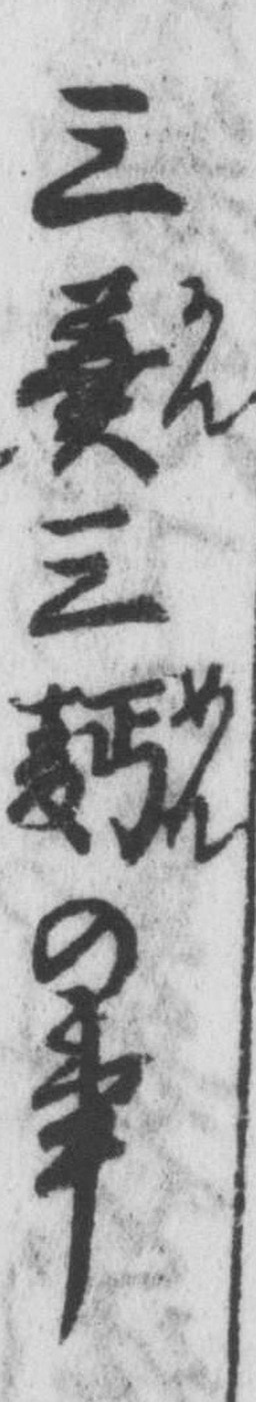三羹三麪の也
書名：当世料理献立
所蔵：大阪府立大学学術情報センター 国文学研究資料館
